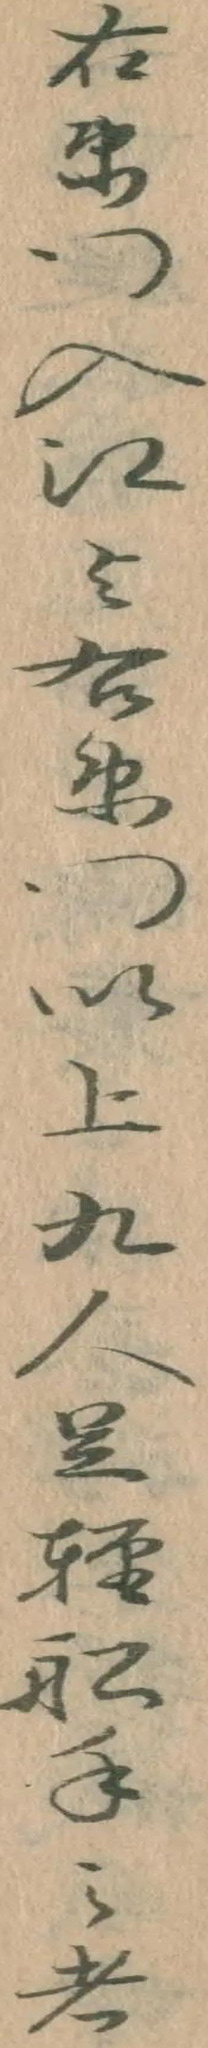右衛門入江与右衛門以上九人足軽舩出之者
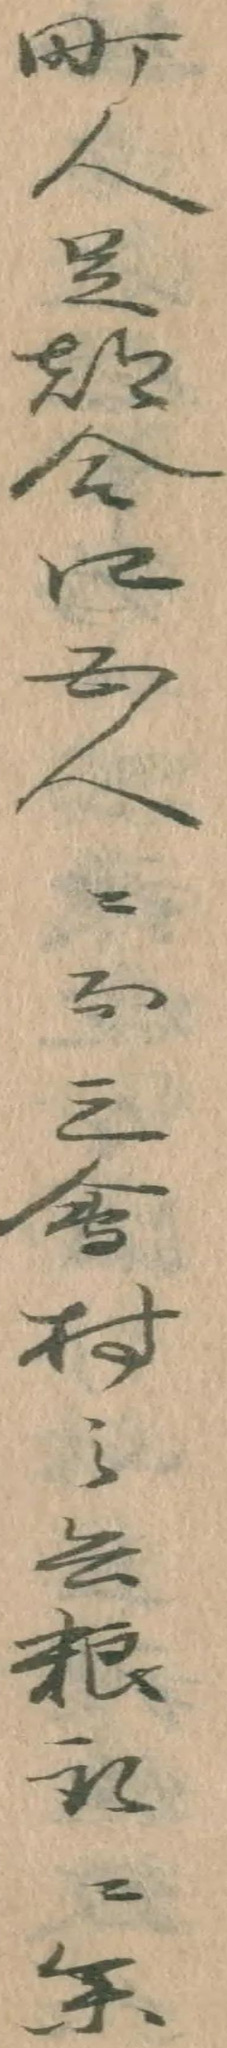町人足都合四五人に而三会村之兵粮取に参
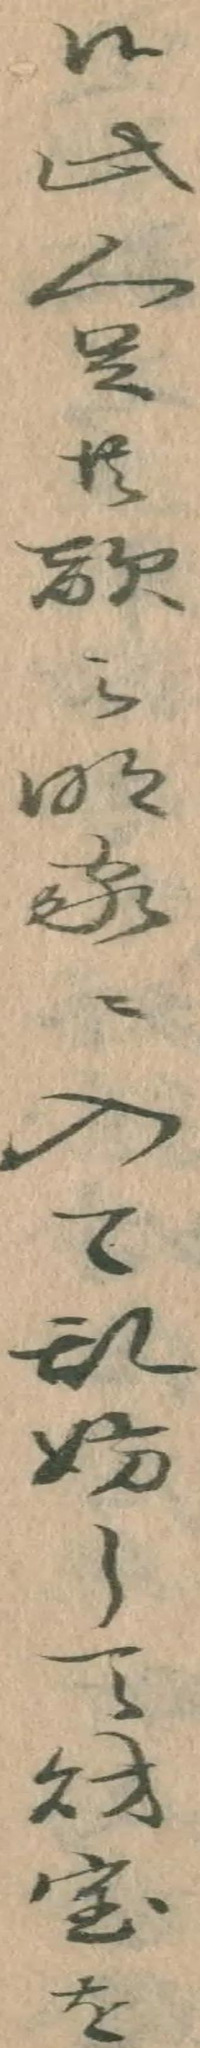候此人足共敵之明家に入て乱妨して財宝を
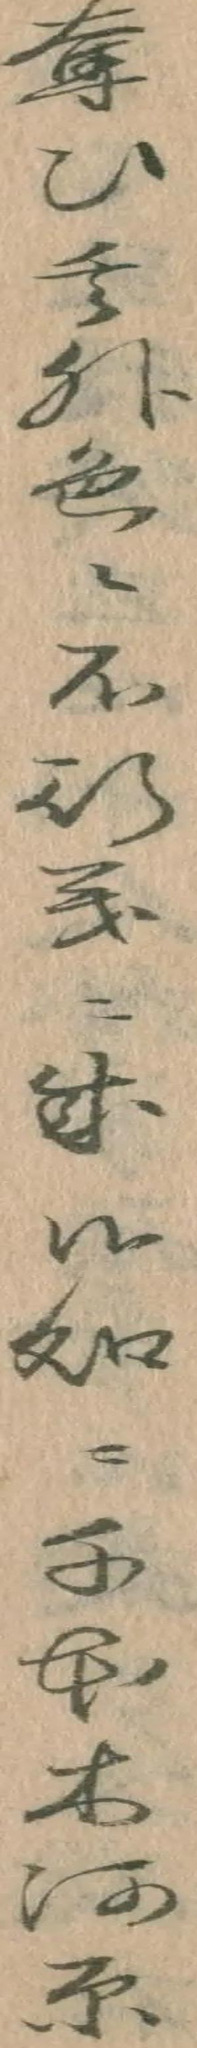奪ひ其外色々不行義に成候処に千本木河原
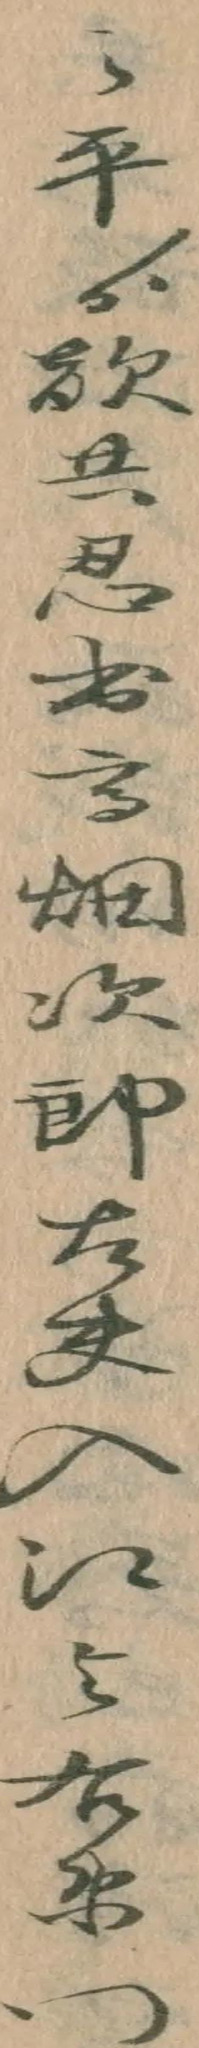之平ゟ敵共忍出高畑次郎太夫入江与右衛門
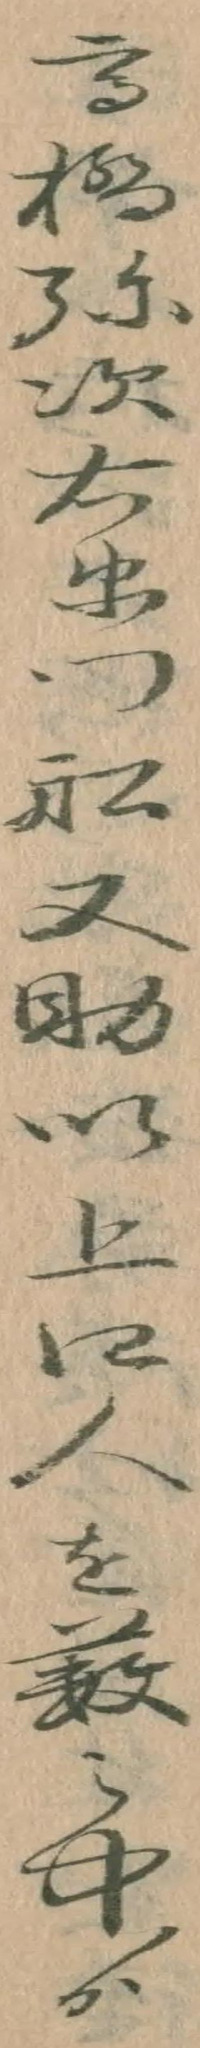高橋弥次右衛門舩又助以上四人を藪之中ゟ
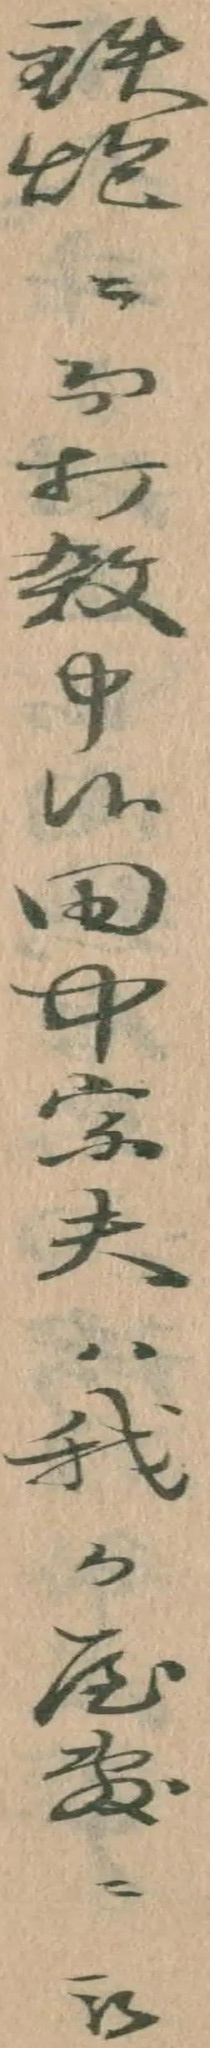鉄炮に而打殺申候田中宗夫は我か屋敷に被
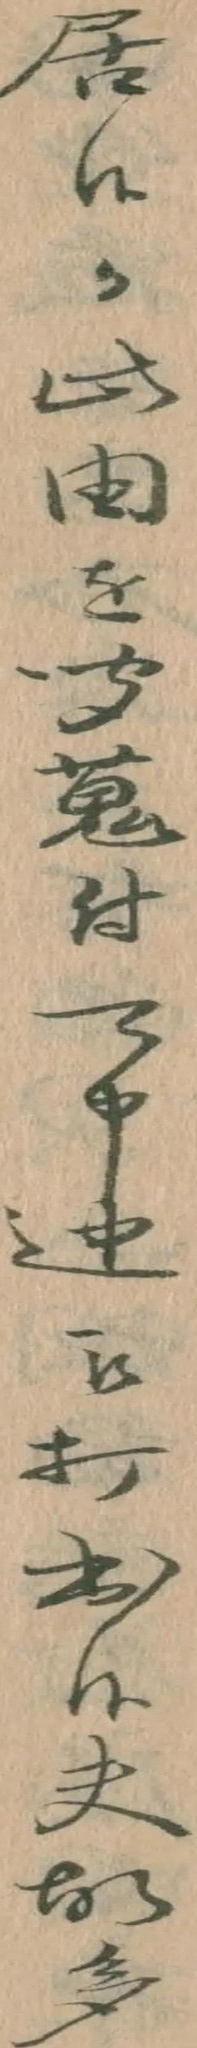居候か此由を聞蒐付可申迚被打出候夫故多
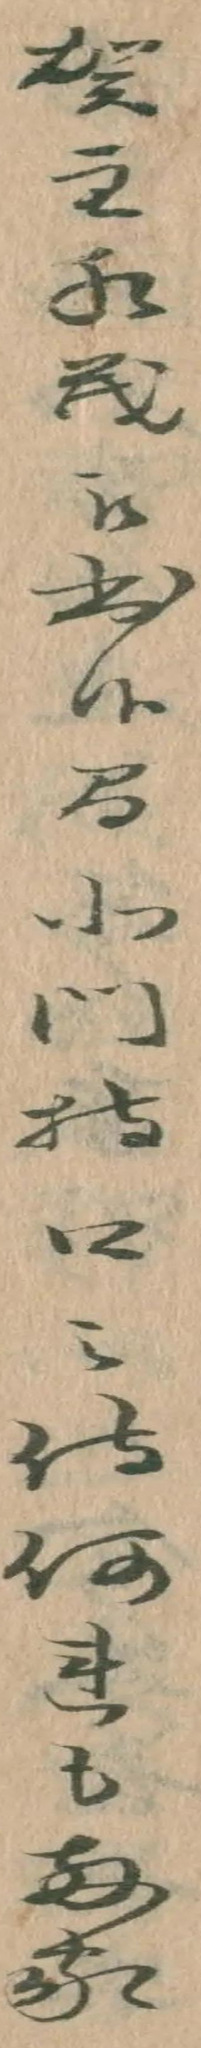賀主水茂被出候間北門持口之侍何連も両家
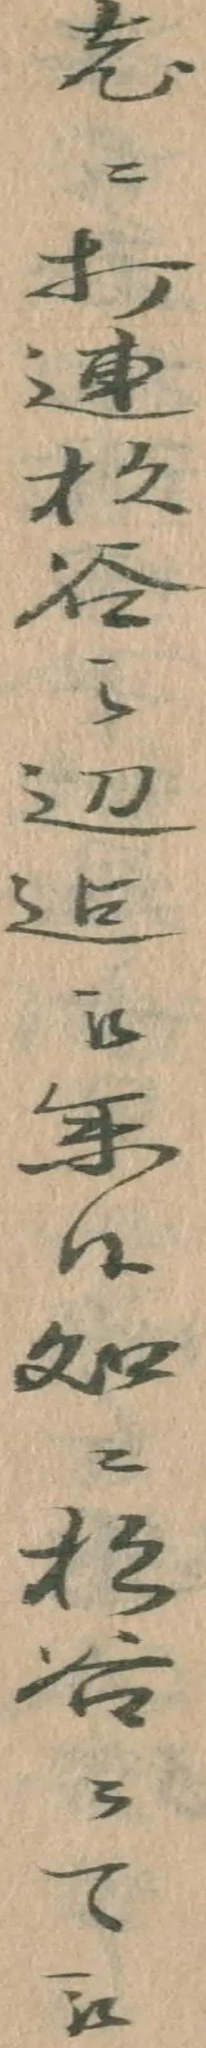老に打連杉谷之辺迄被参候処に杉谷にて被
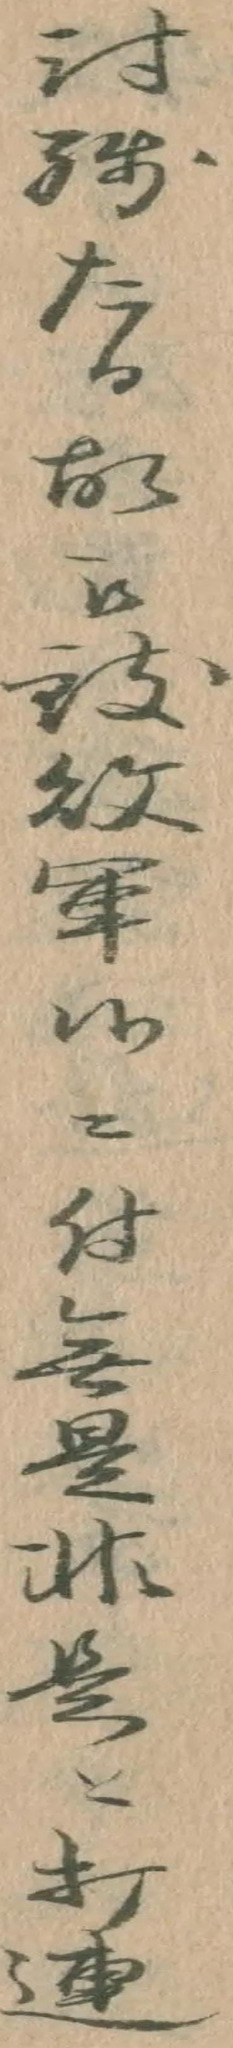討残たる故被致敗軍候に付無是非是と打連
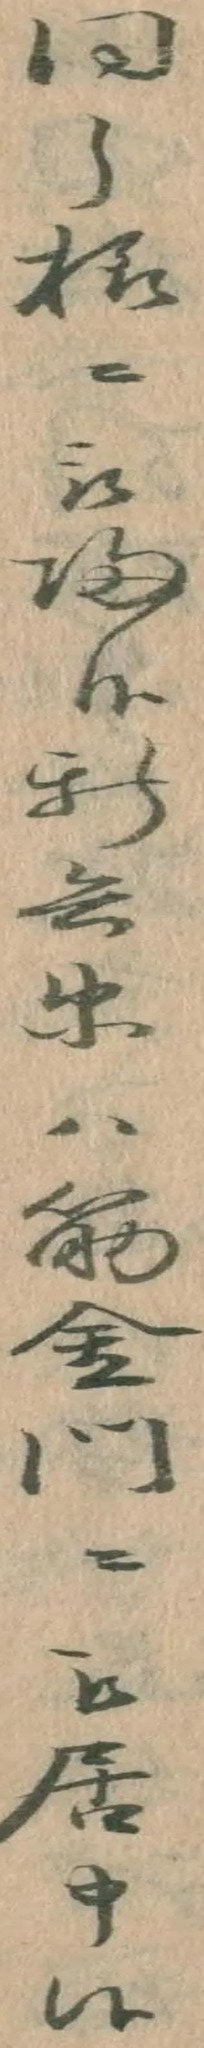同し様に被帰候新兵衛は筋金門に被居申候
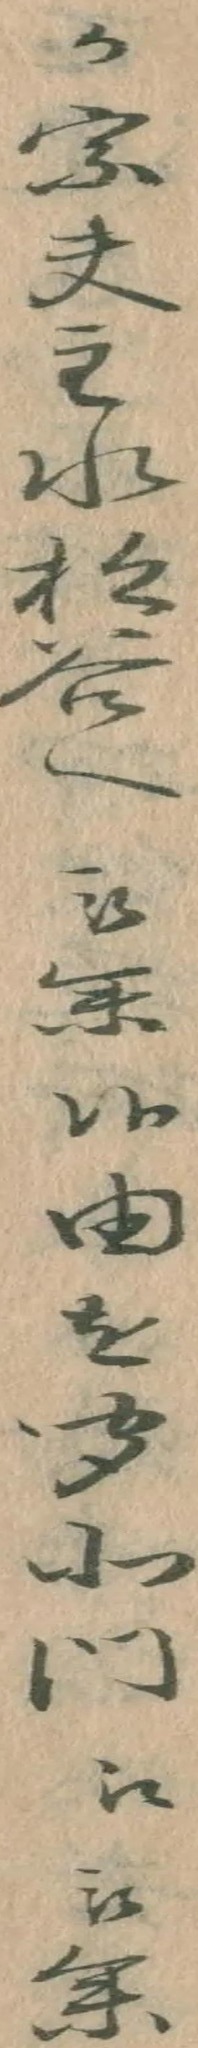か宗夫主水杉谷へ被参候由を聞北門江被参
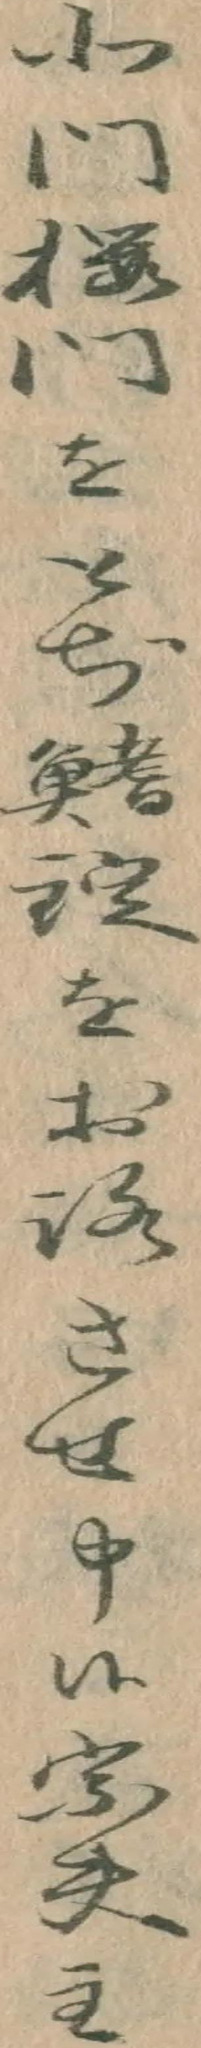北門楼門をとぢ鰭錠をお路させ申候宗夫主
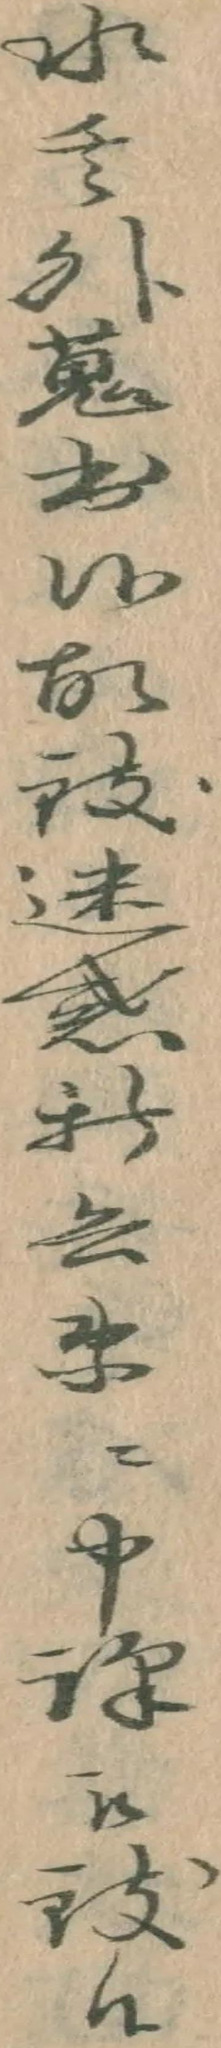水其外蒐出候故致迷惑新兵衛に申訳被致候
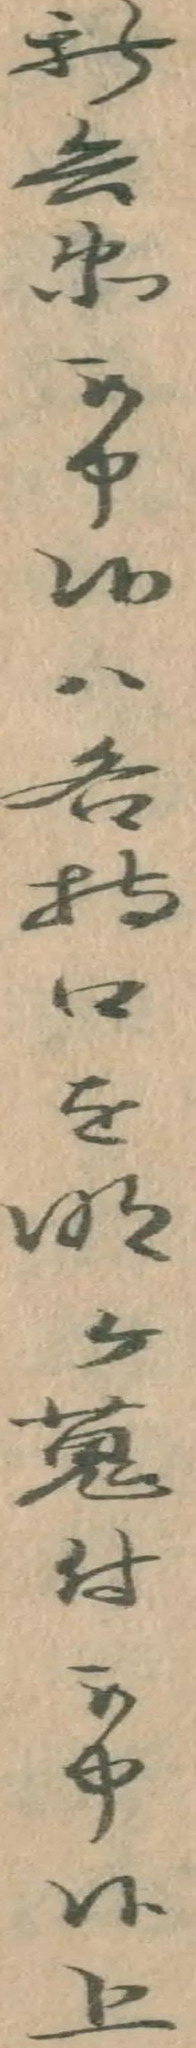新兵衛被申候は各持口を明け蒐付被申候上
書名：切支丹御退治記 49巻. [2]
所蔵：国立国会図書館 National Diet Library, JAPAN
